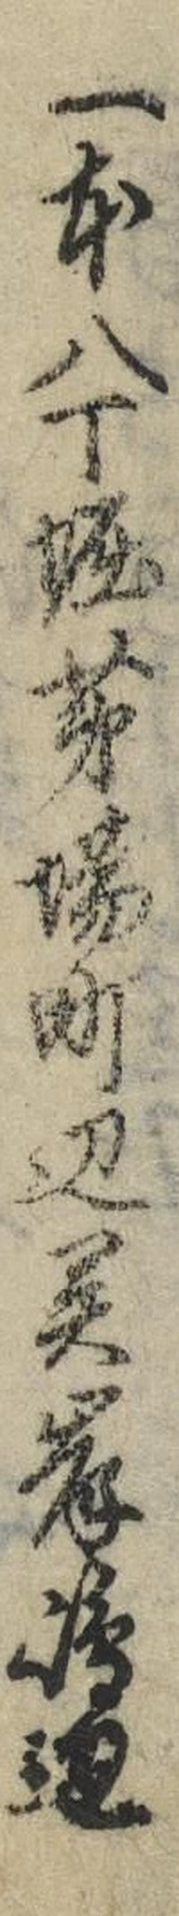一本八丁堀茅場町辺霊岸嶋辺
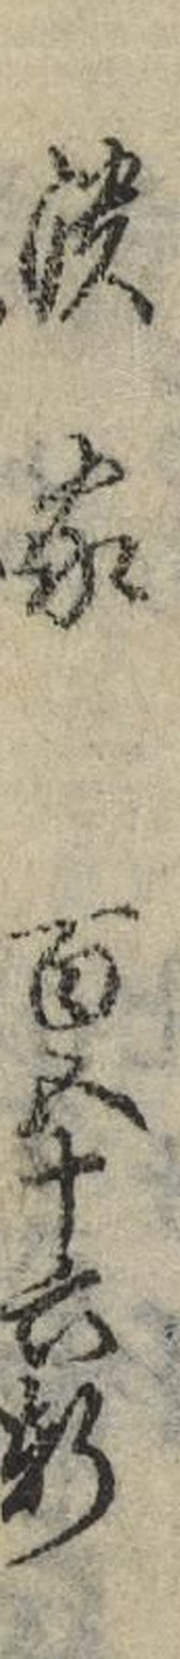潰家百五十六軒
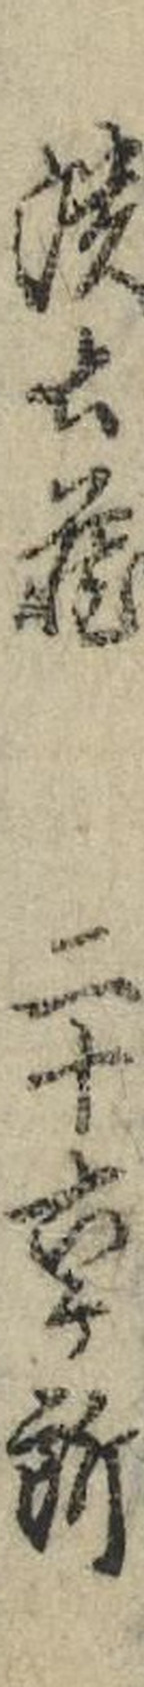潰土蔵二十六ケ所
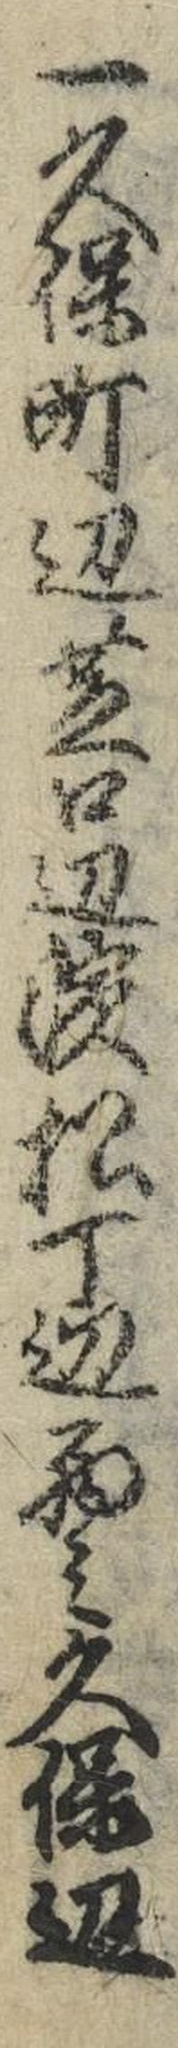一久保町辺芝口辺濱松丁辺西之久保辺
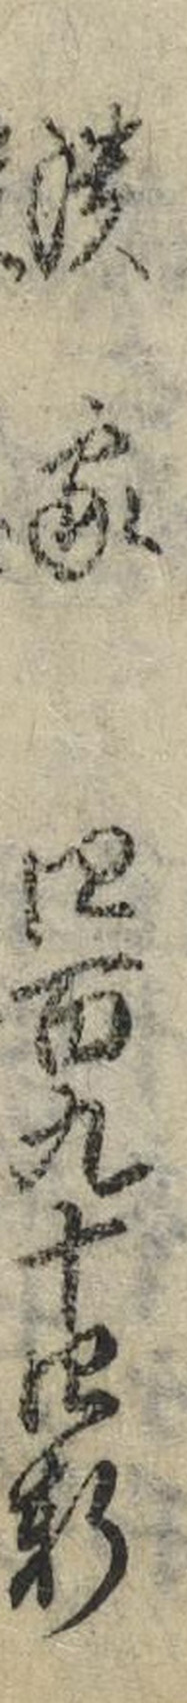潰家四百九十四軒
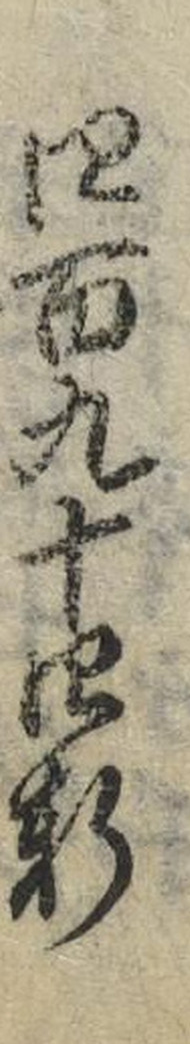潰家四百九十四軒
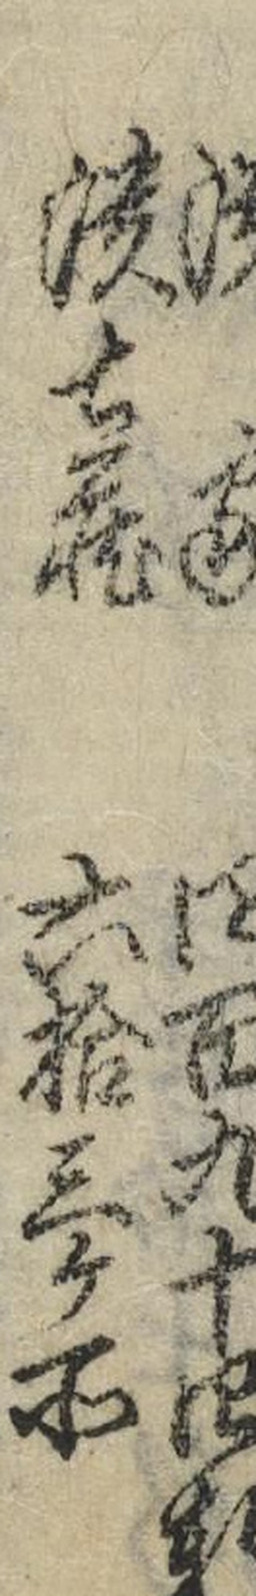潰土蔵六十三ケ所
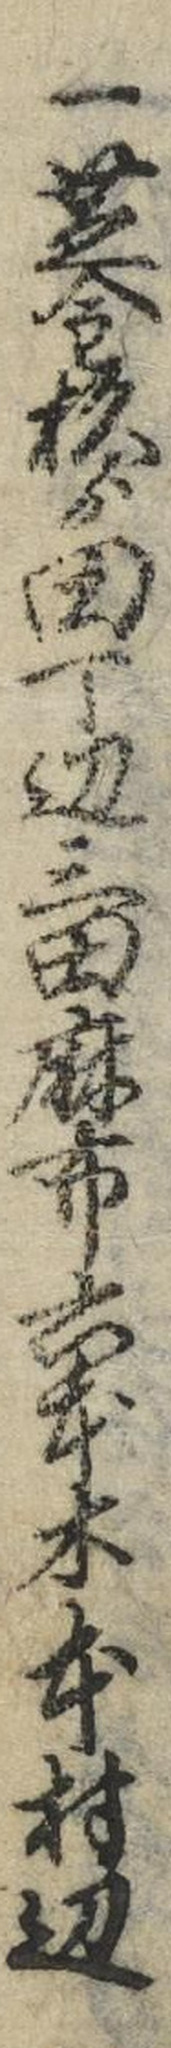一芝金杉ゟ田丁辺三田麻布六本木本村辺
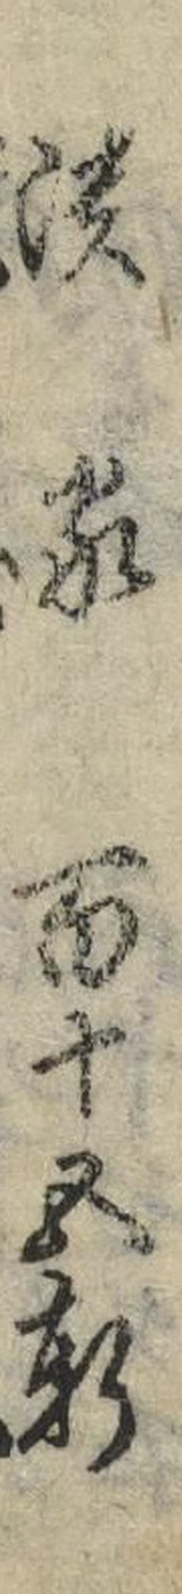潰家百十五軒
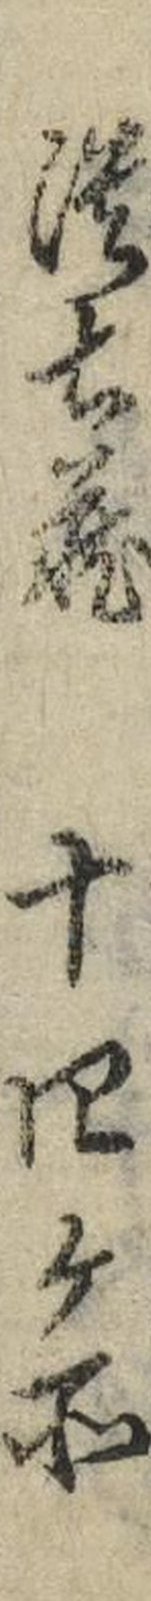潰土蔵十四ケ所
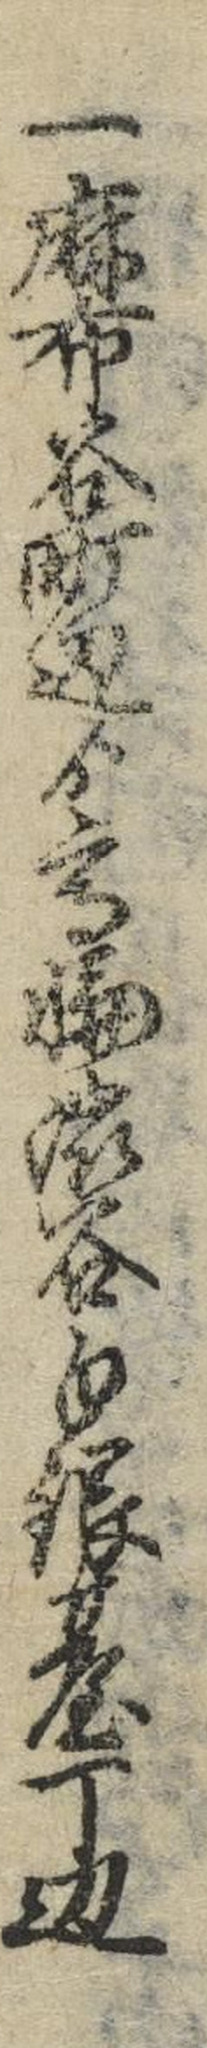一麻布谷町辺ゟ高輪渋谷白銀臺丁辺
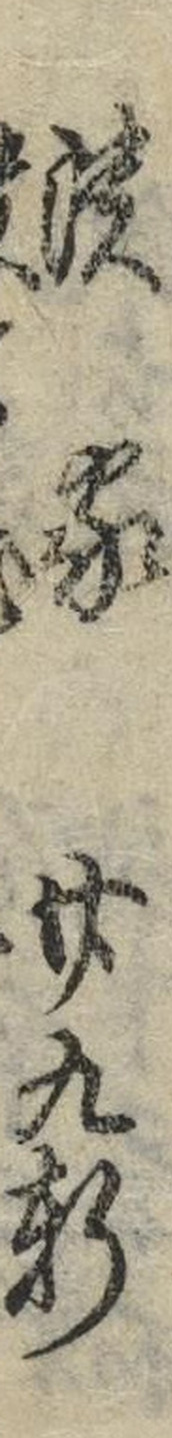潰家廿九軒
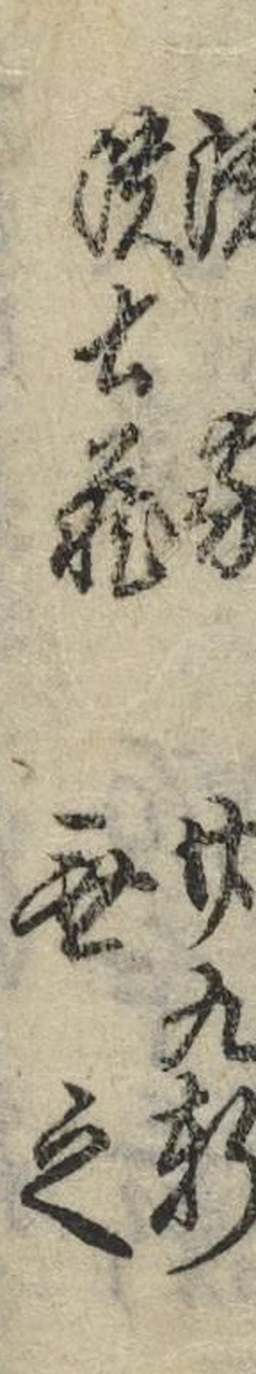潰土蔵無之
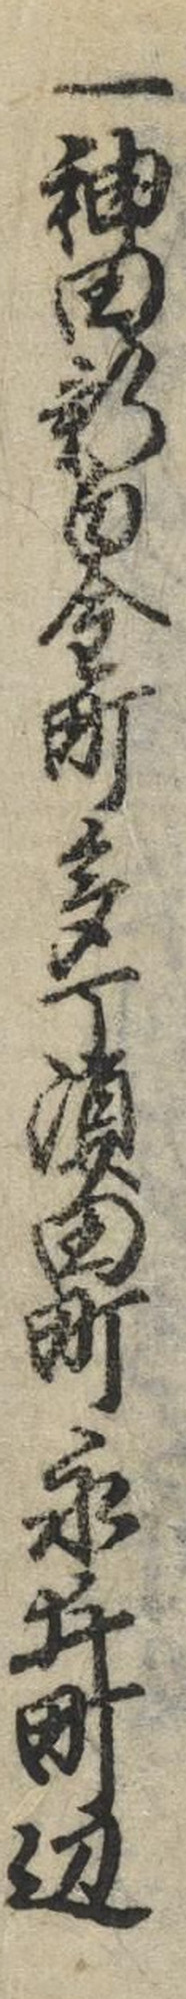一神田新白金町多丁須田町永井町辺
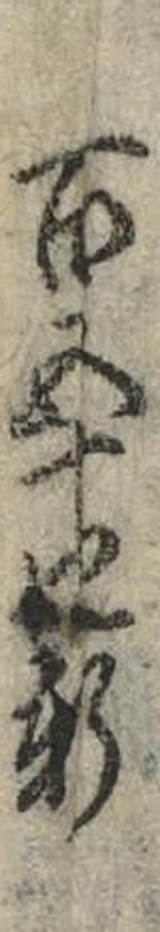潰家百五十四軒
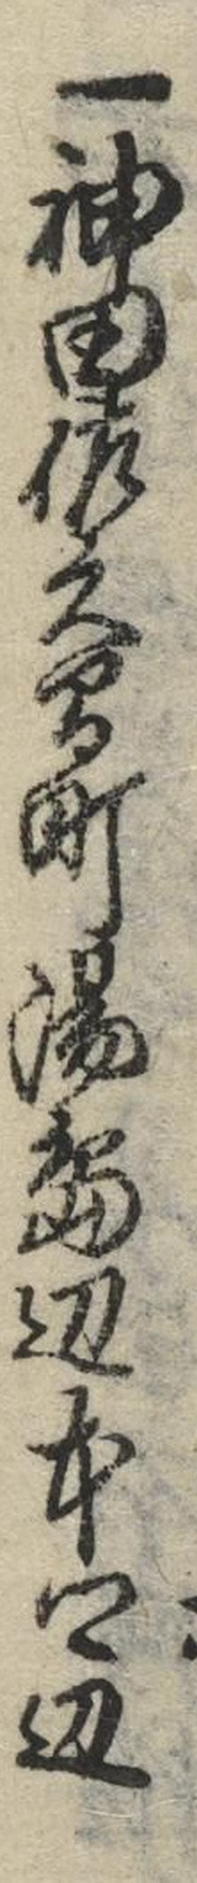一神田佐久間町湯島辺本郷辺
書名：江戸御屋鋪方町方共　地震類焼場所巨細書之寫　潰家潰土蔵共取調附街道筋近在迄
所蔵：東京大学地震研究所図書室 Earthquake Research Institute Library, The University of Tokyo, JAPAN
